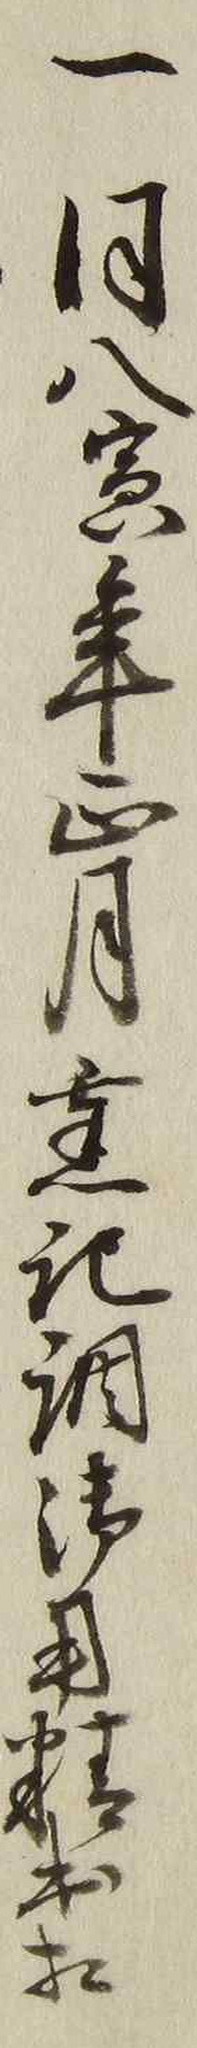一同八寅年正月旧記調御用精出相
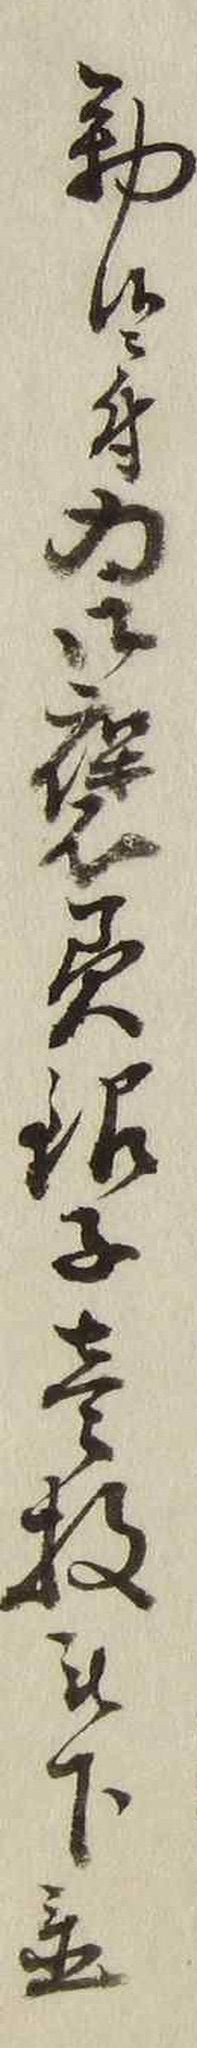勤候ニ付為御褒美銀子壱枚被下置

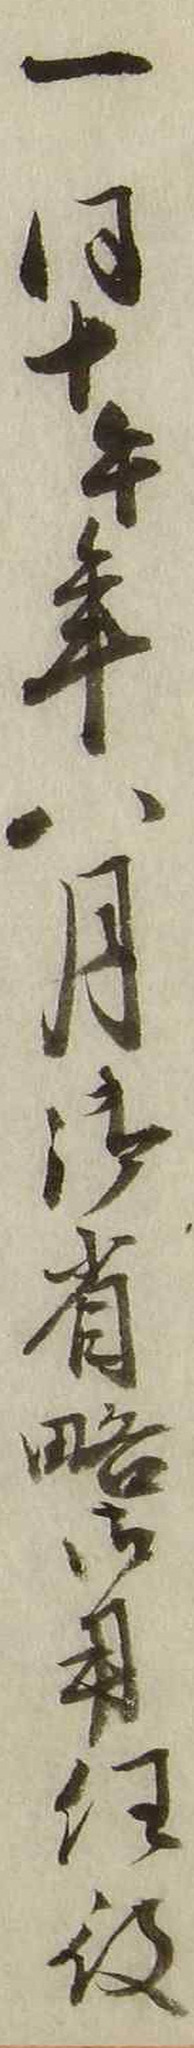一同十午年八月御省略御用任役
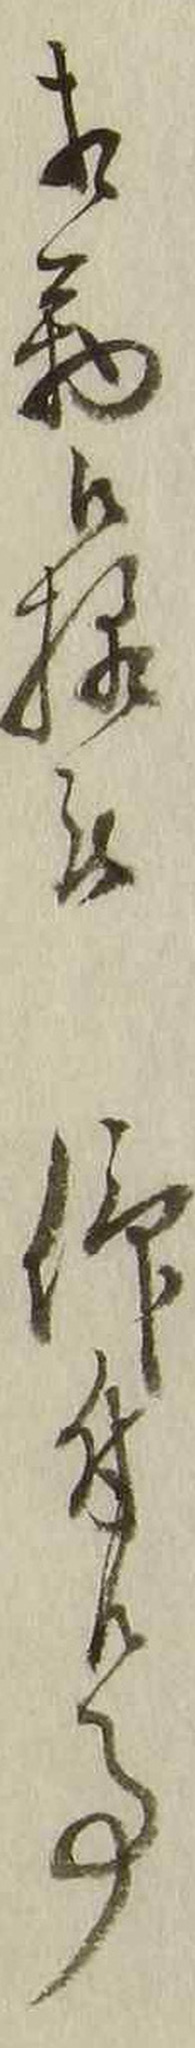相勤候様被仰付候事
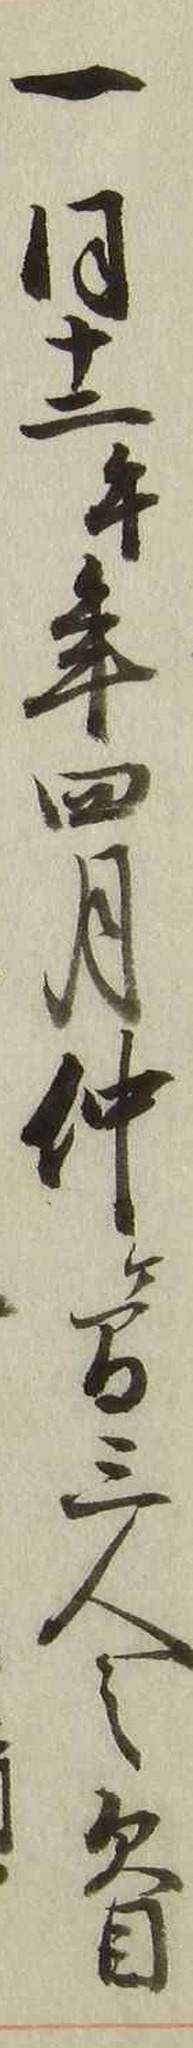一同十二午年四月仲ケ間三人之欠目
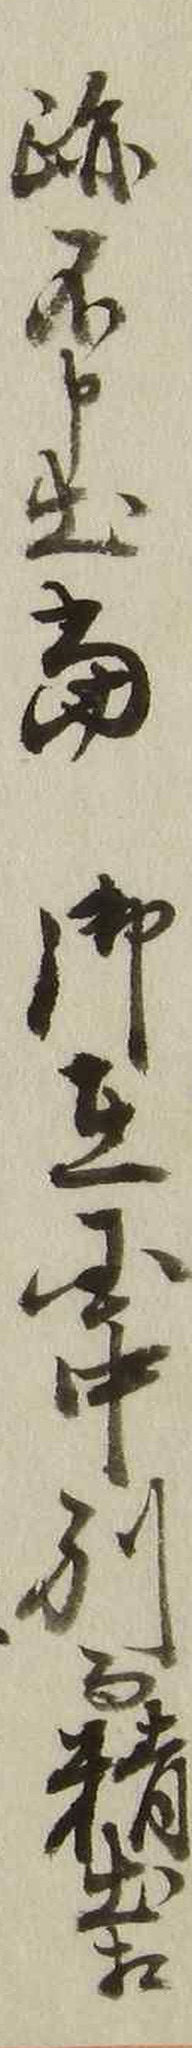跡不申出当御在国中別而精出相
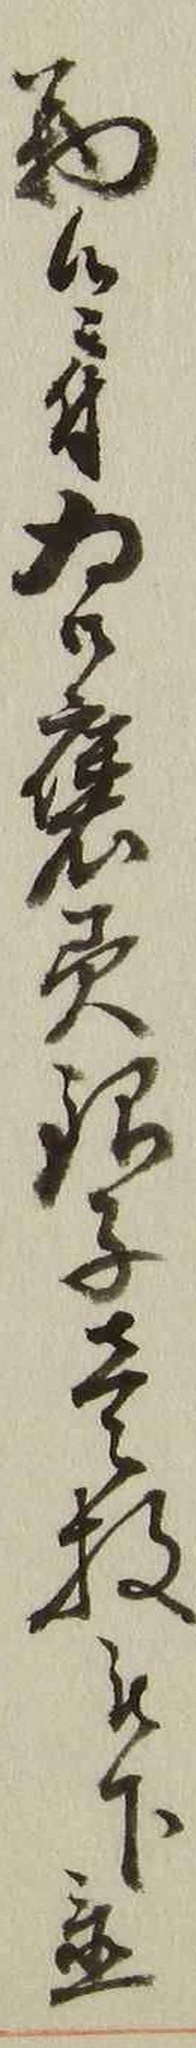勤候ニ付為御褒美銀子壱枚被下置
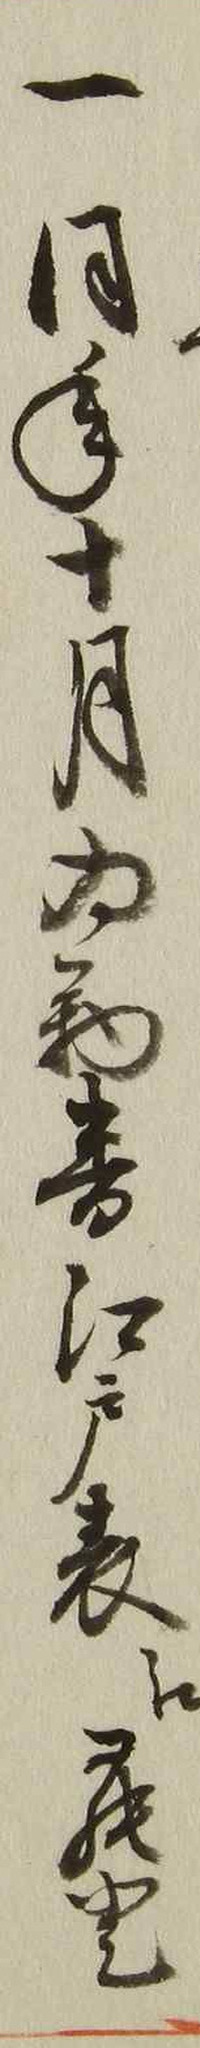一同年十月為勤番江戸表江罷登
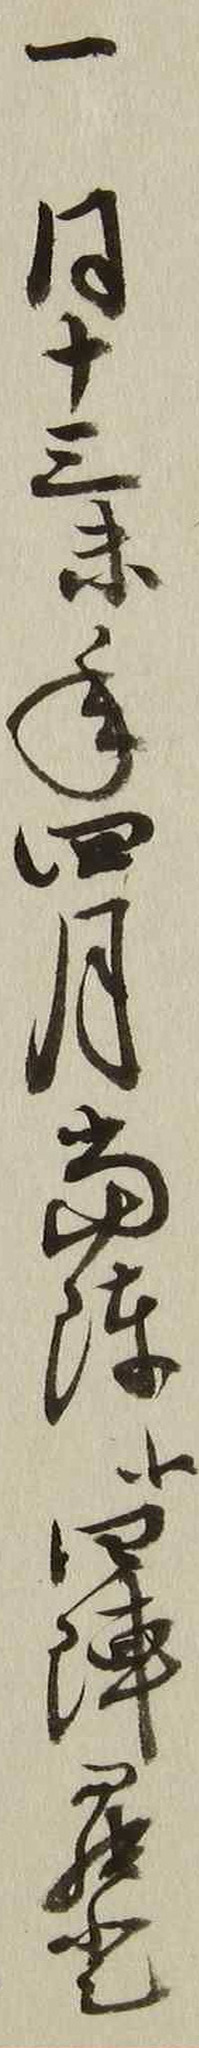一同十三未年四月当陳江四陣罷登
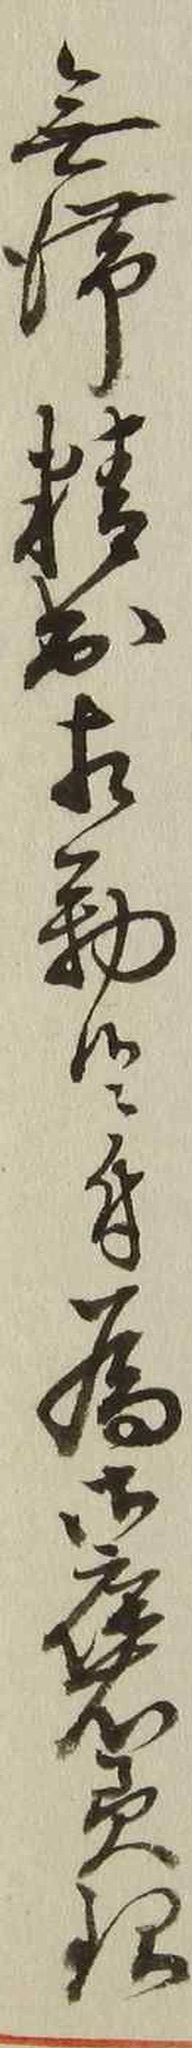無滞精出相勤候ニ付為御褒美銀
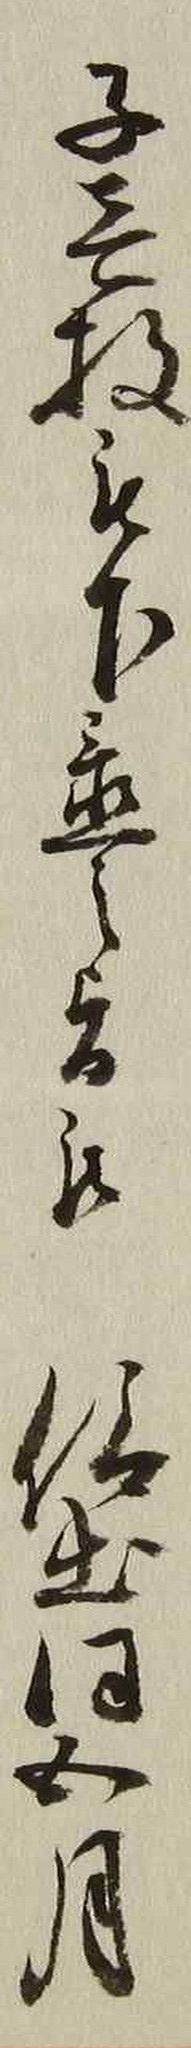子壱枚被下置之旨被仰出同五月
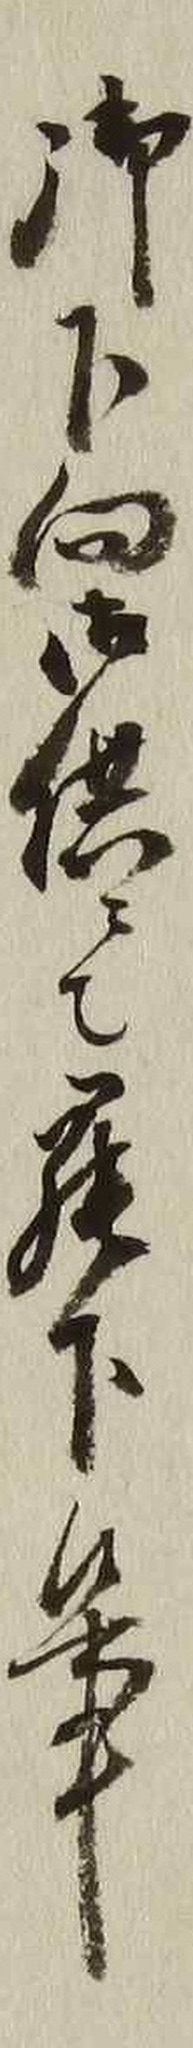御下向御供ニて罷下候事
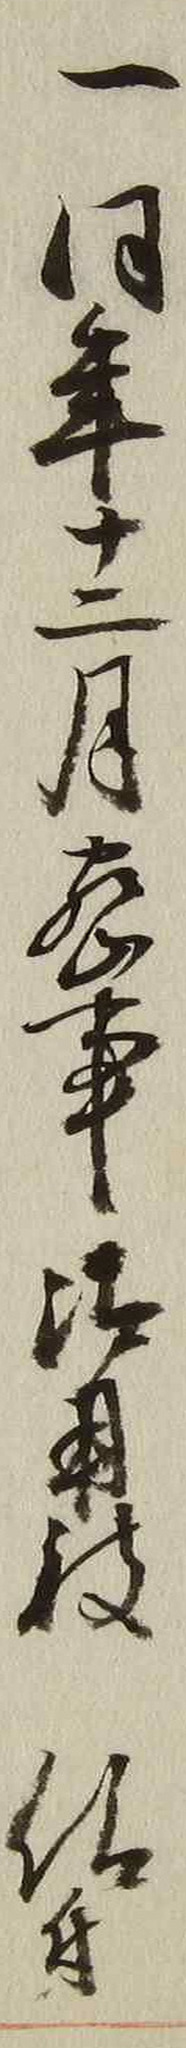一同年十二月密事御用被仰付
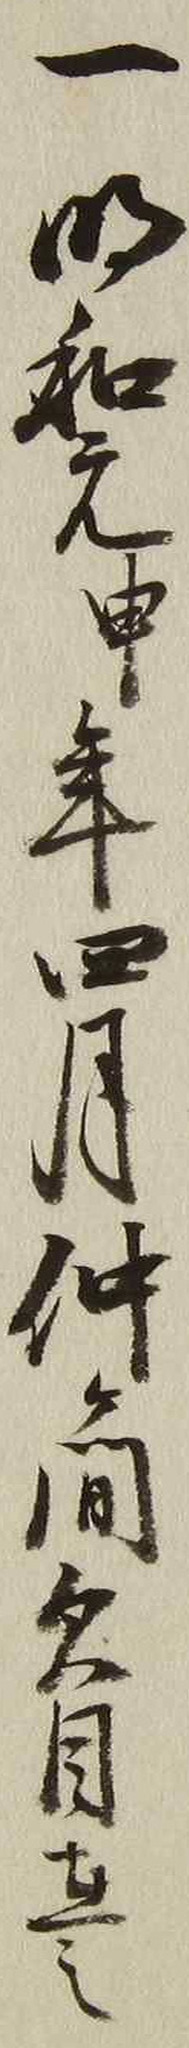一明和元申年四月仲ケ間欠目在之
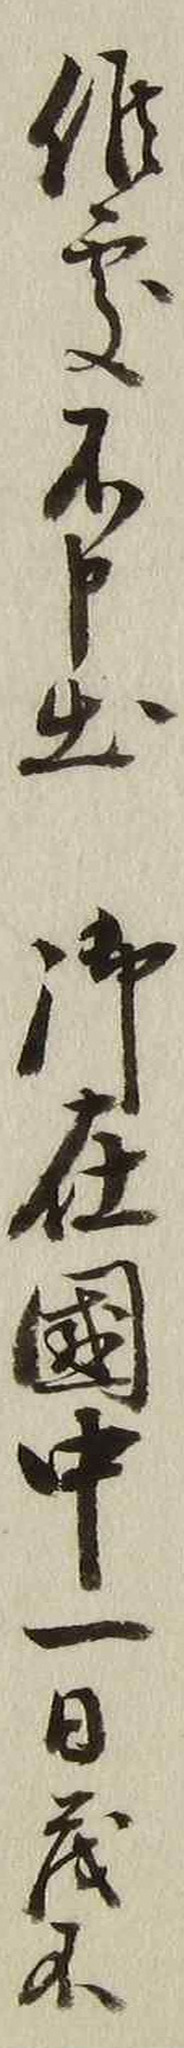候処不申出御在国中一日茂不
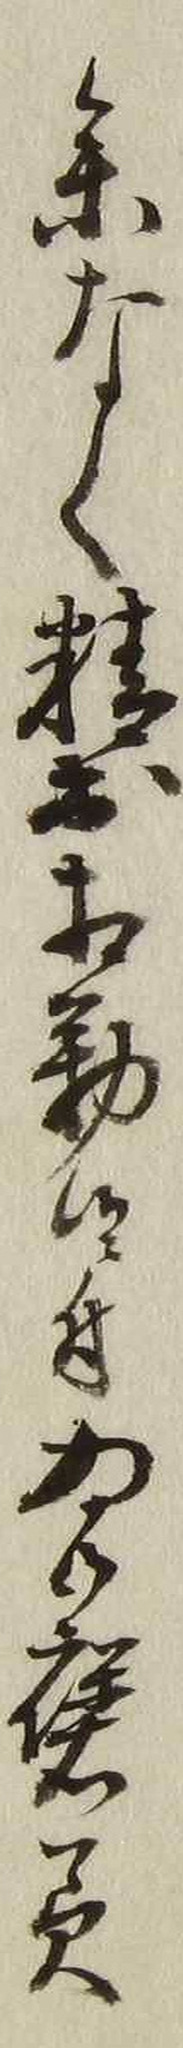参なく精出相勤候ニ付為御褒美
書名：諸士系譜　巻之27　い之部27
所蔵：会津若松市立会津図書館
